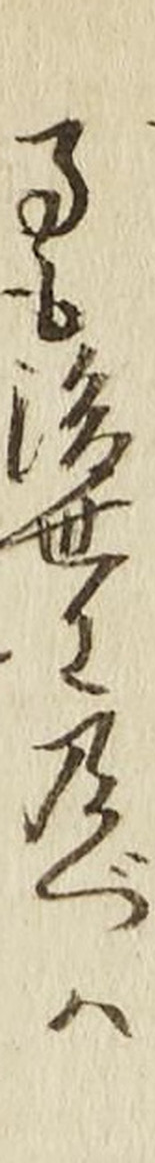事も後世に及べは
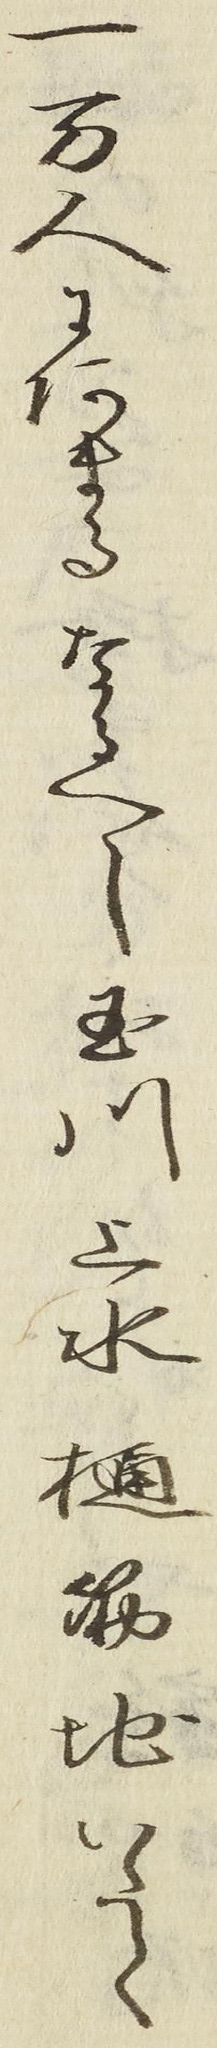一万人にあまるなるへし玉川上水樋筋地いたく
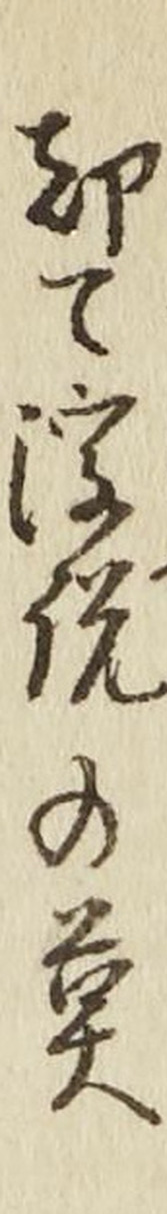却て浮説の莫
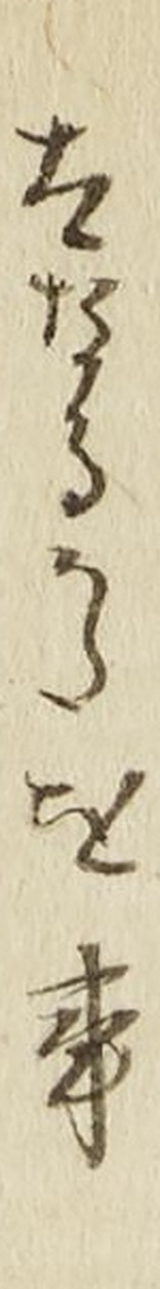太なるかたを事
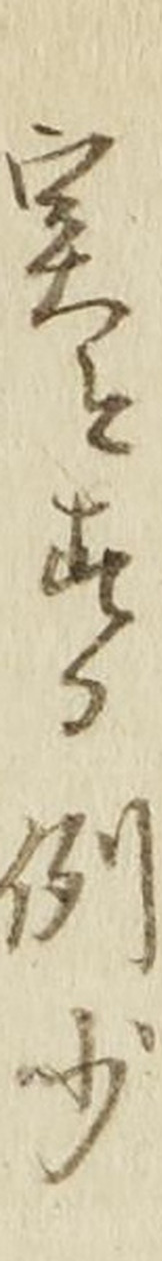実とする例少
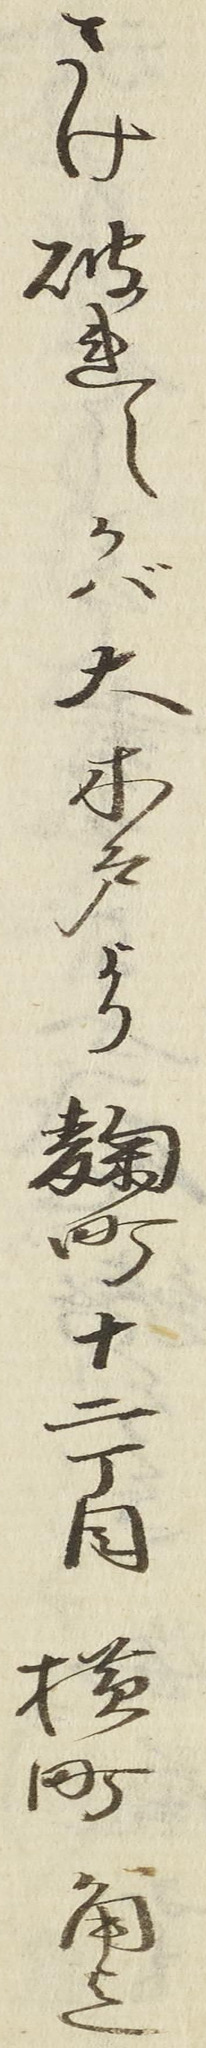さけ破れしかば大木戸より麹町十二丁目横町角迄
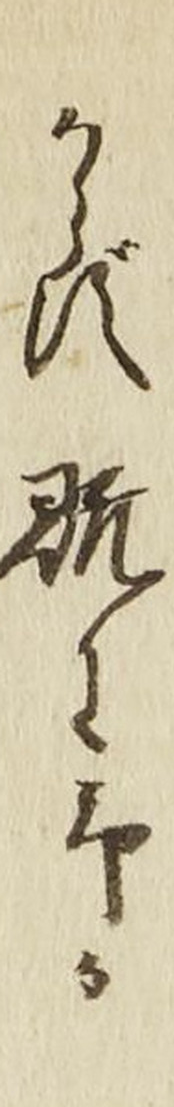からず既に予か
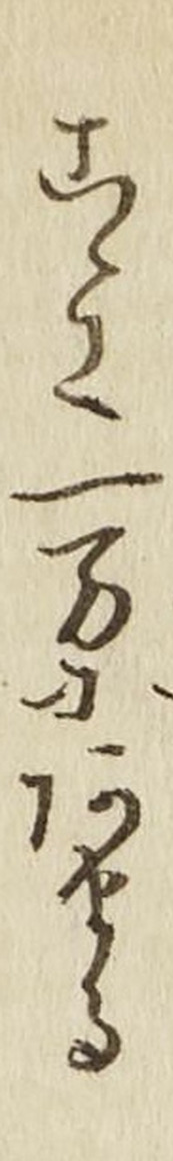こゝに一万にあまる
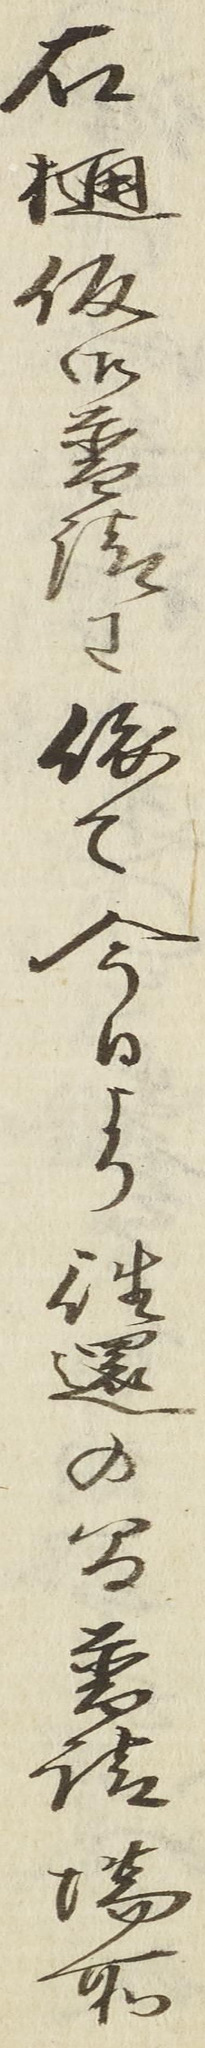右樋仮御普請に依て今日より往還の間普請場所
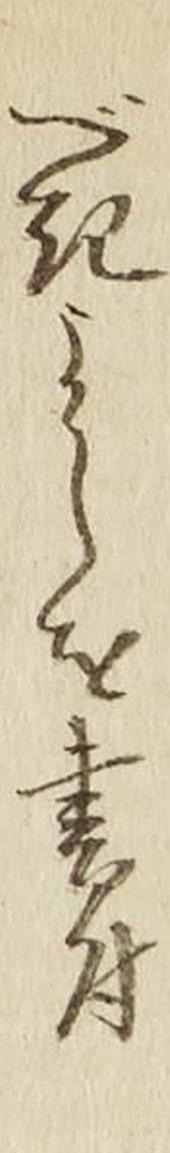べきよしを書付
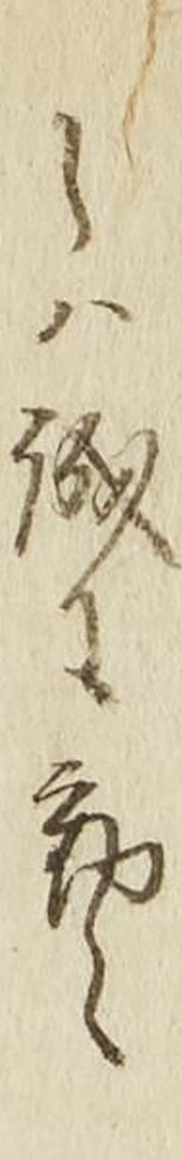しは誠に動く
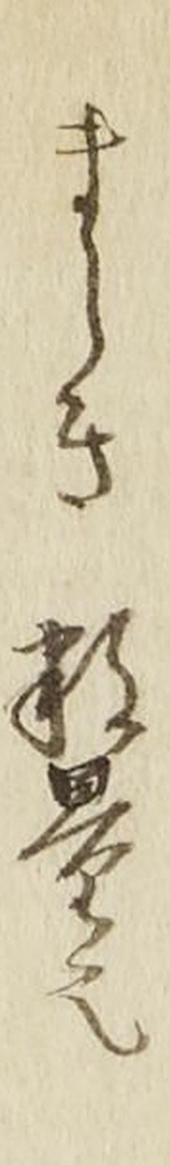ましき数量也
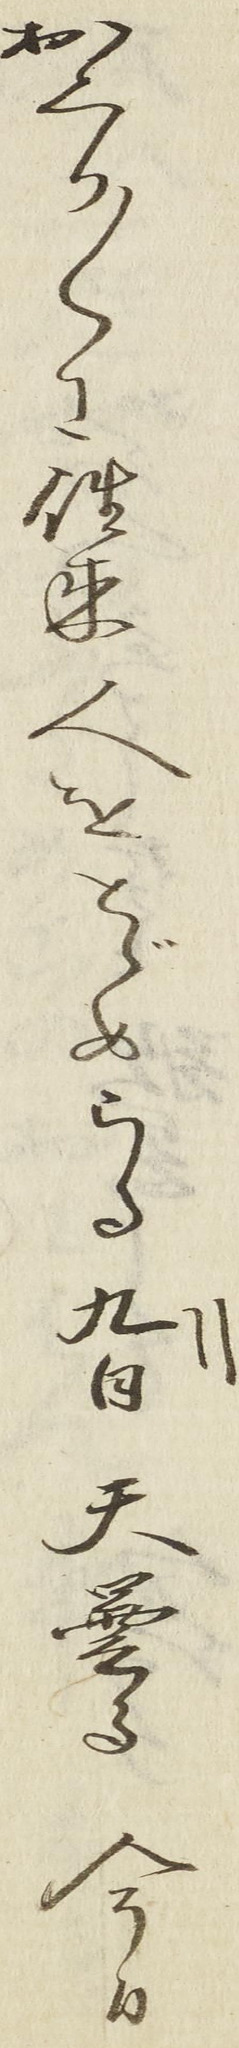おくり〳〵に往来人をとゞめらる九日天曇る今日
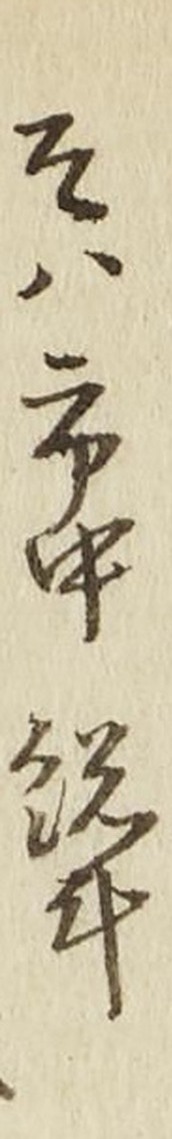そは市中総計
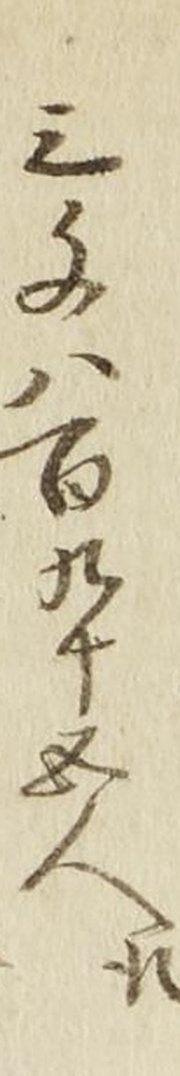三千八百九十五人え
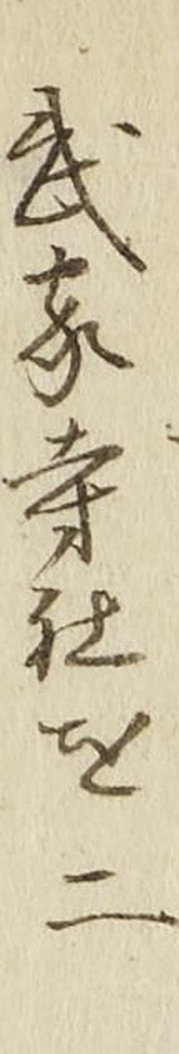武家寺社を二
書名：やぶれ窓の記　全
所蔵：東京大学地震研究所図書室 Earthquake Research Institute Library, The University of Tokyo, JAPAN
